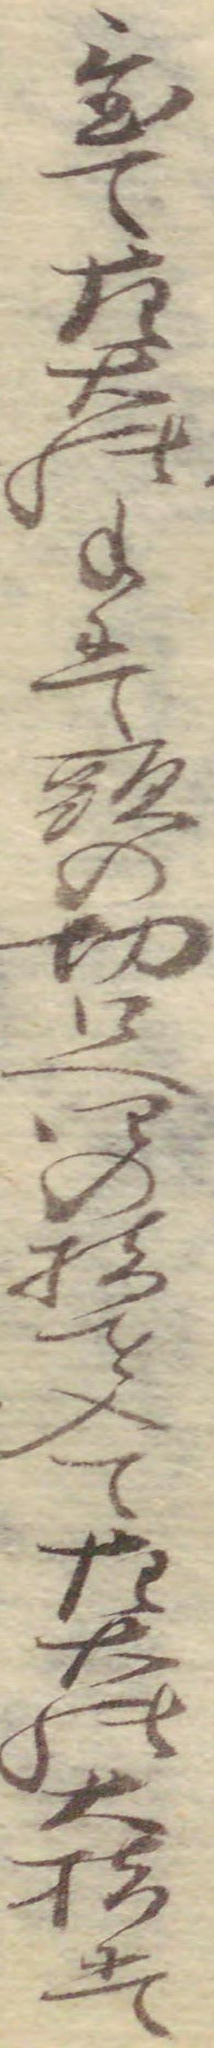置て左右の手にて頭の切口へ四の指を入て左右の大指にて
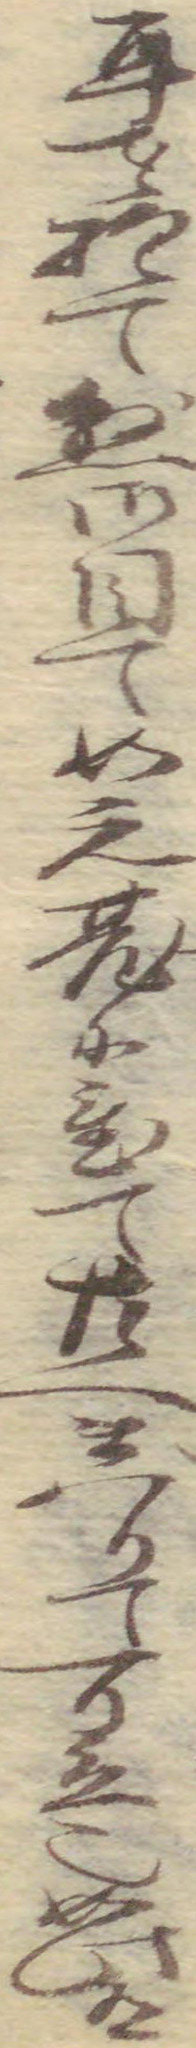耳を抱て懸御目て如元䑓に置て左へまハりて可立也如此有
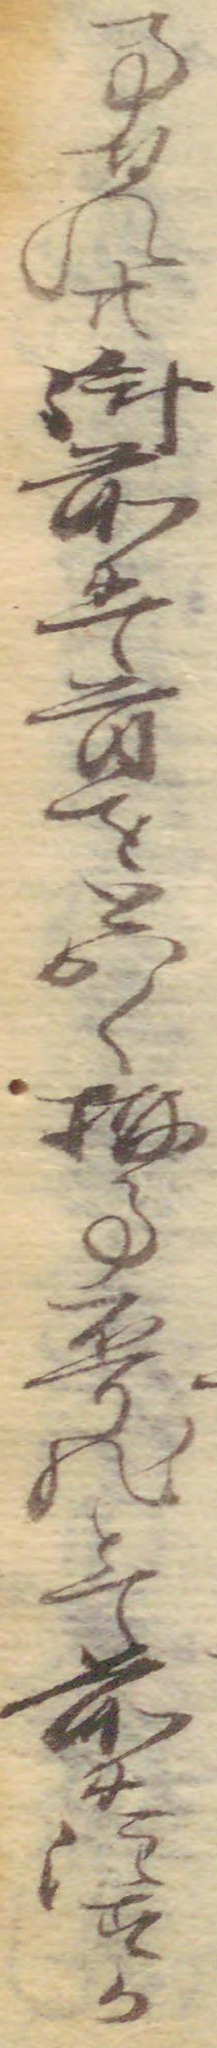事なれ共御前にて首をとかく拵事不可然とて前に記する

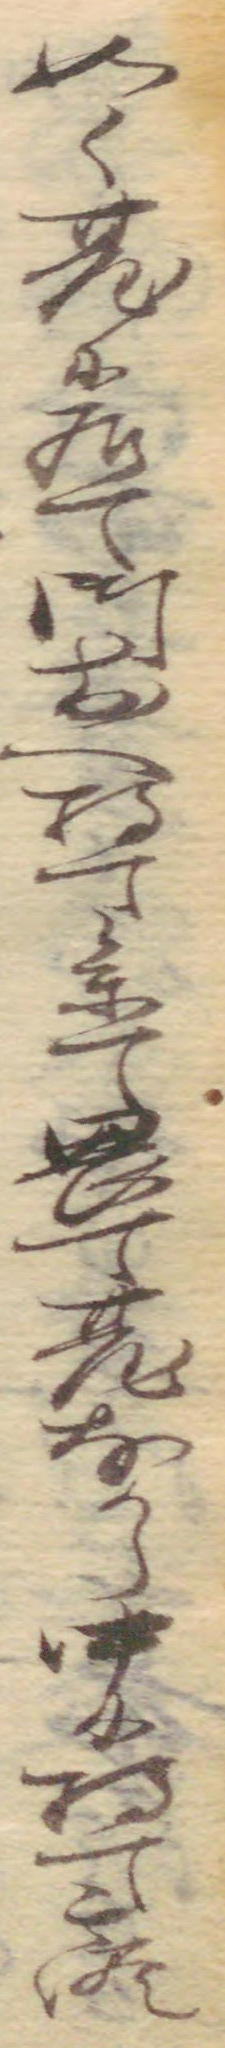如く䑓に居て御前へ持て参て畏て䑓なから中に持て其儘
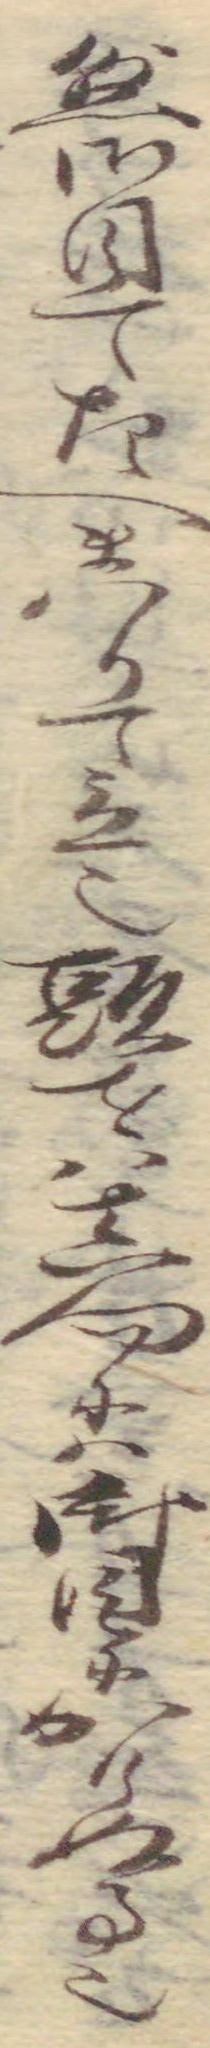懸御目て左へまハりて立也頭をハ真向にハ御目にかけぬ事也
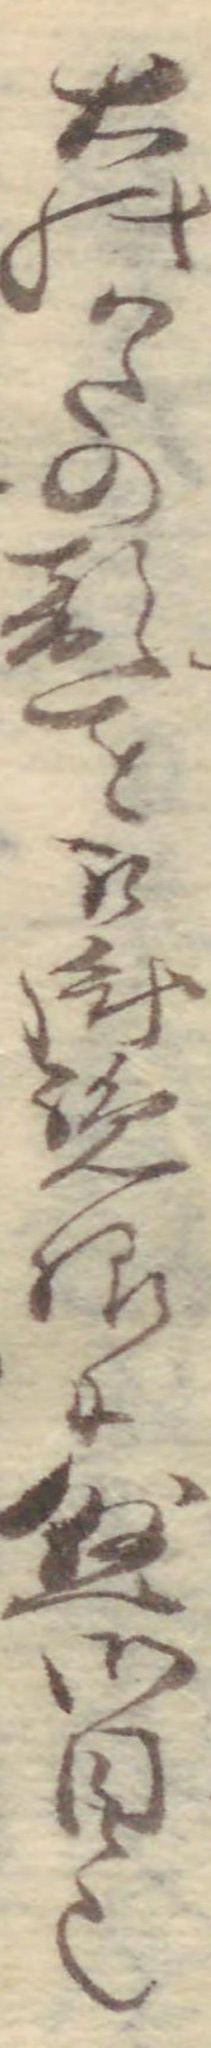右のかたの顔を被御覧様に懸御目也
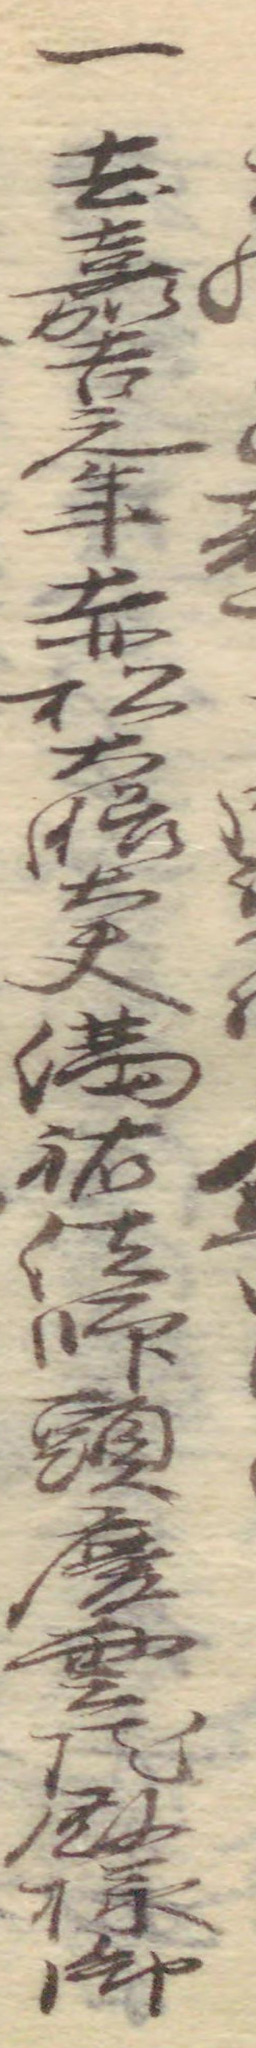一去嘉吉之年赤松大膳大夫満祐法師頭慶雲院殿様御
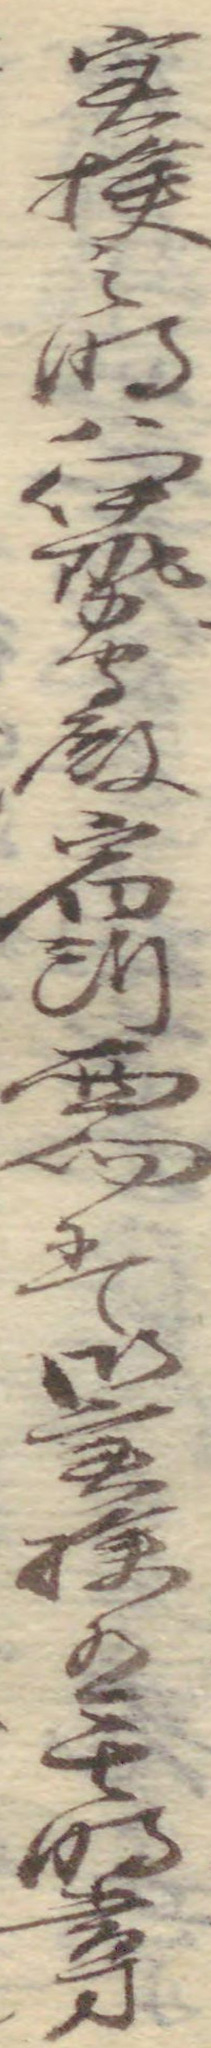実検の時ハ伊勢守殿宿所西向にて御実検有其時当方
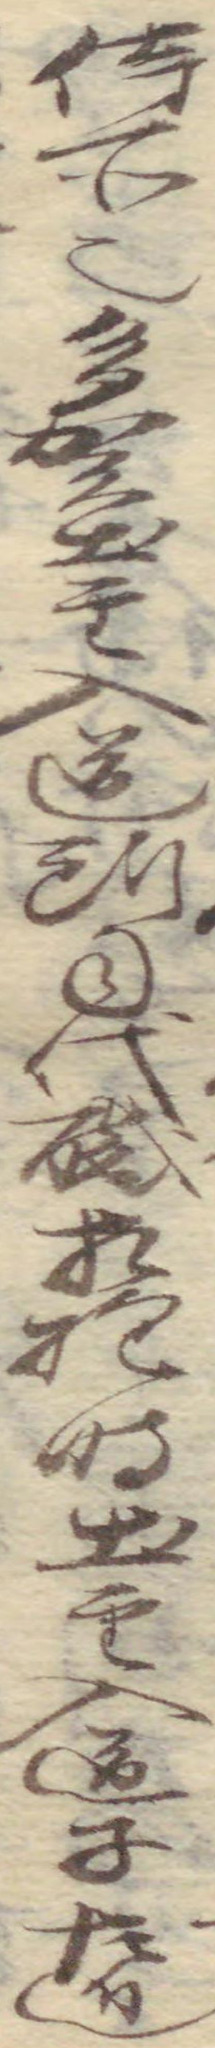侍所也多賀出雲入道所司代職相抱時出雲入道子左近
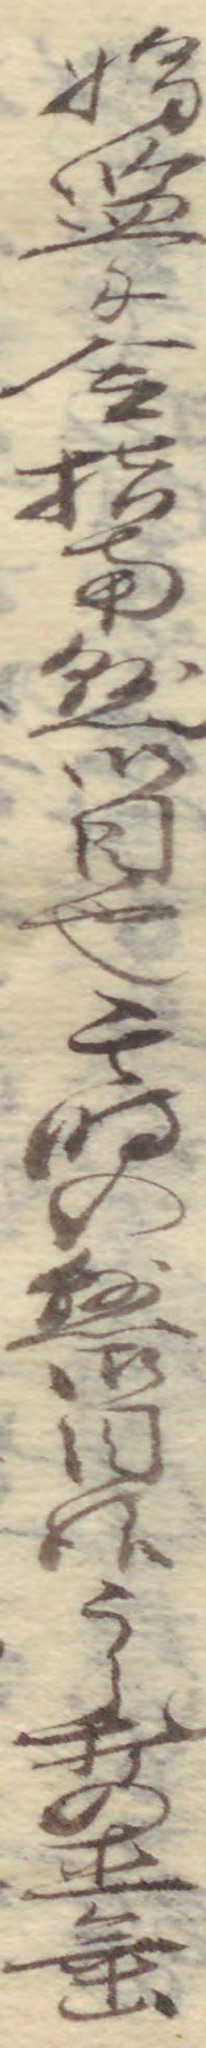将監に令指南懸御目也其時の懸御目様うら打の直垂
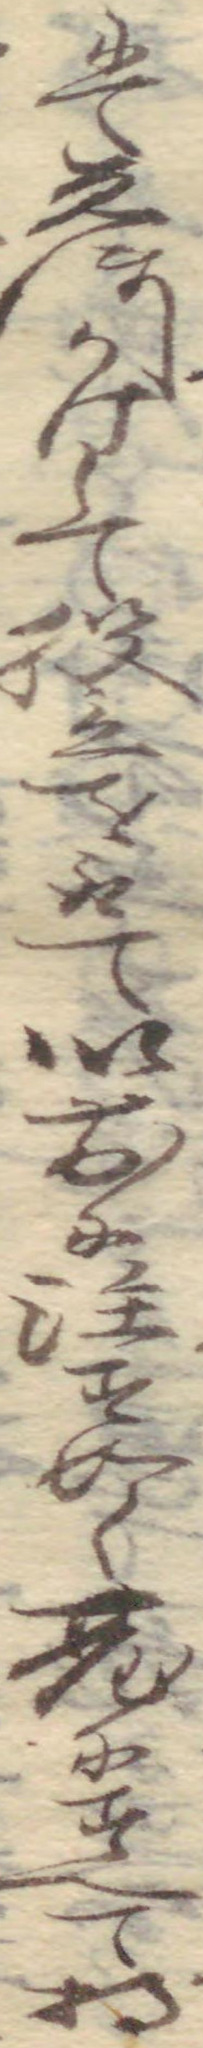にえゑほしかけして股立を取て以前に注す如く䑓にすへて持
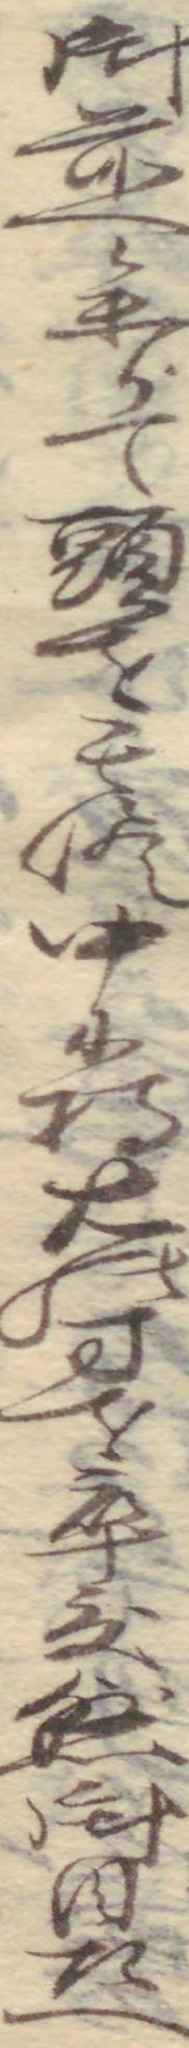御前へ参りて頭を其儘中に持右の方を卒度懸御目左へ
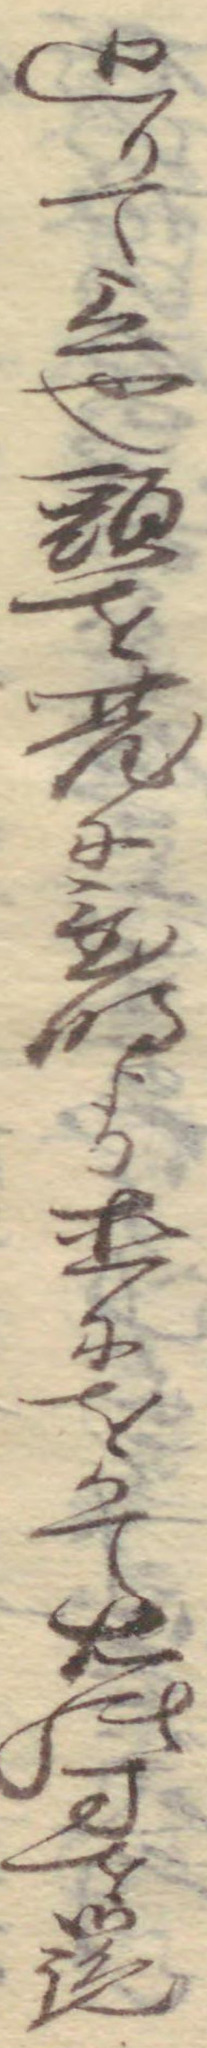廻りて立也頭を臺に置時より直にをかて右の方を御覧
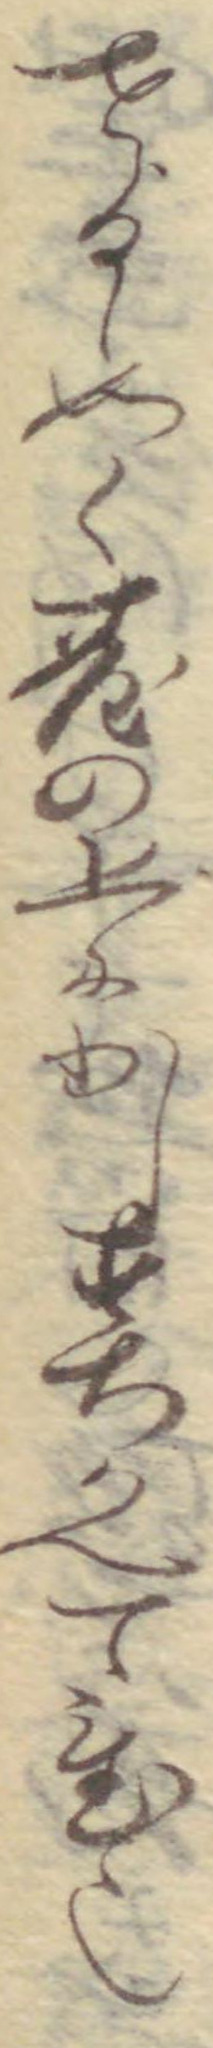せらるゝ如く臺の上に少しすちかへて置也
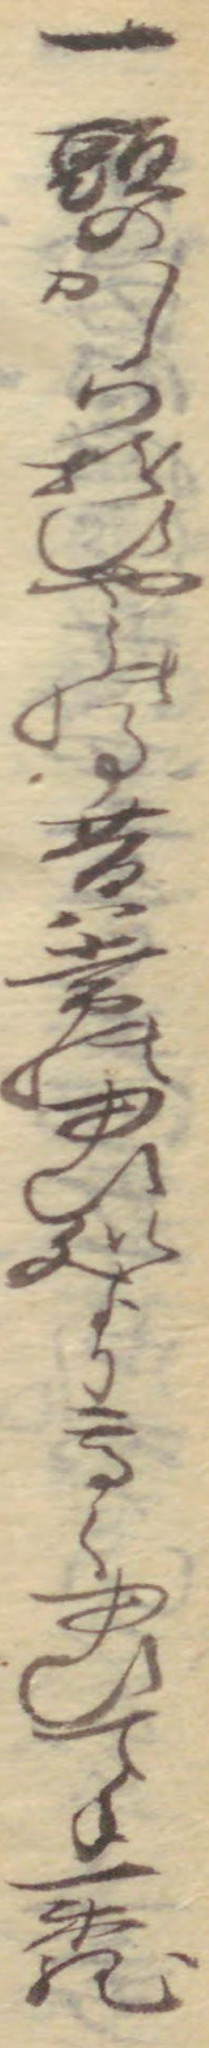一頭のかしら結ひやうの事昔ハ常のゆひ処より高くゆひて手一束程
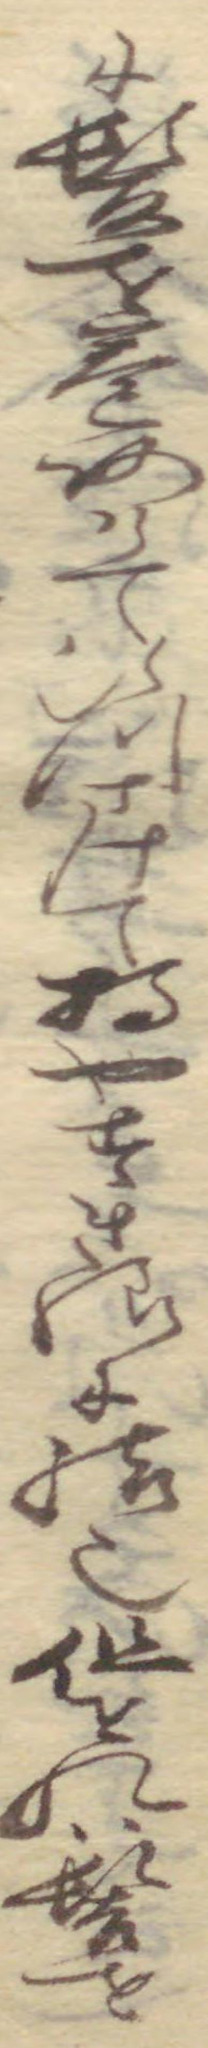に髪を巻あけてひつさけて持やすき様に結也但それは髻を
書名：鶯宿雑記. 巻199-200
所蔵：国立国会図書館 National Diet Library, JAPAN
